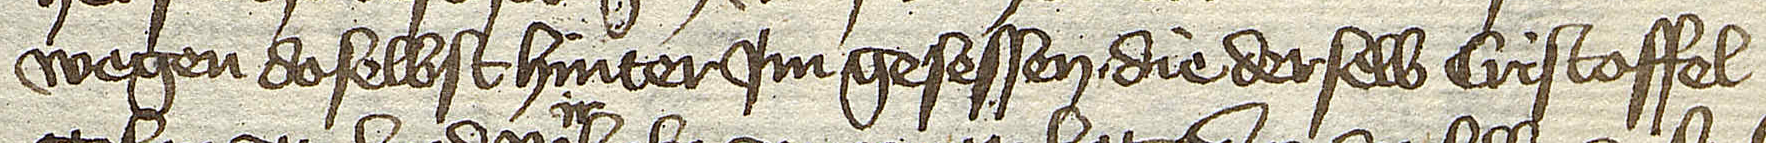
wegen doſelbst hinter Im geſeſſen / die derſelb Criſtoffel
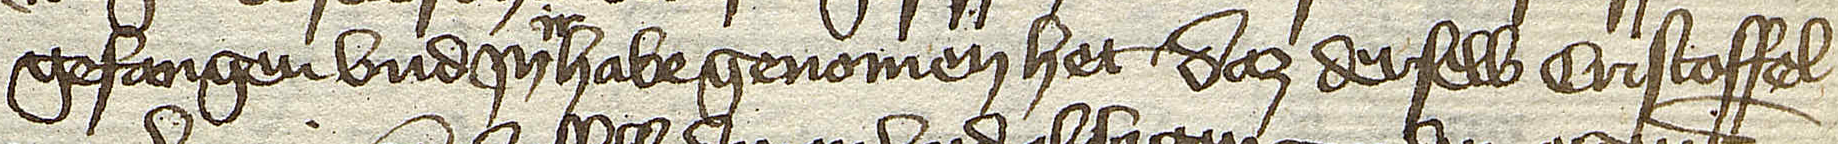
gefangen vnd In habe genomen het / daʒ derſelb Criſtoffel
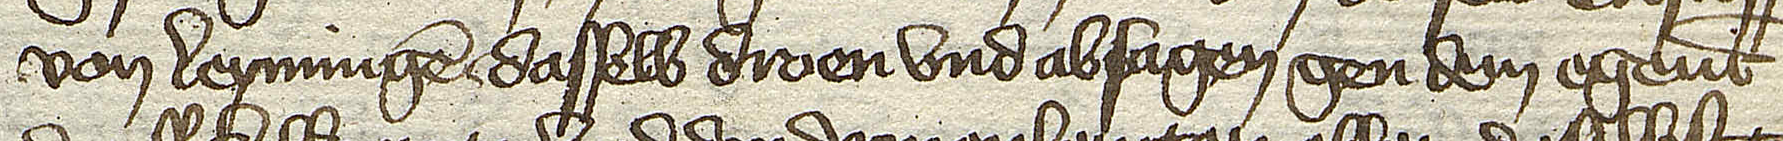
von leyminge* / daſſelb droen vnd abſagen gen dem egent*
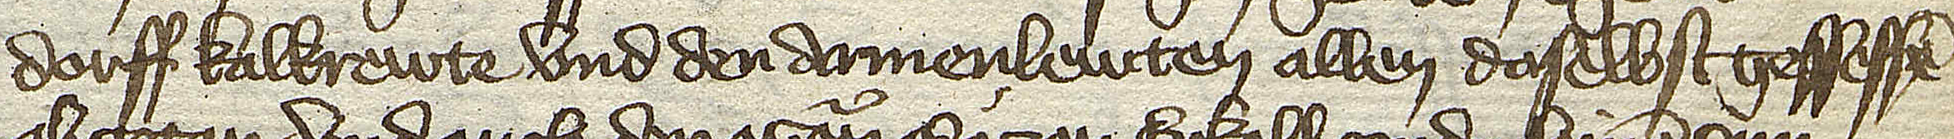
dorff kalkrewte vnd den Armenlewten allen doſelbst geſſeſſe*
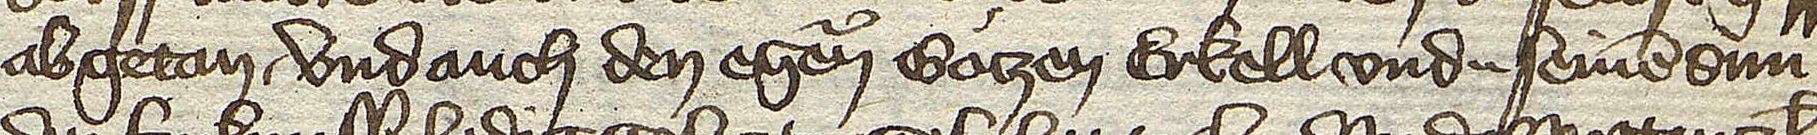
abgetan / vnd auch den egen* Göcʒen Erkell vnd ~ ſeine* Sun
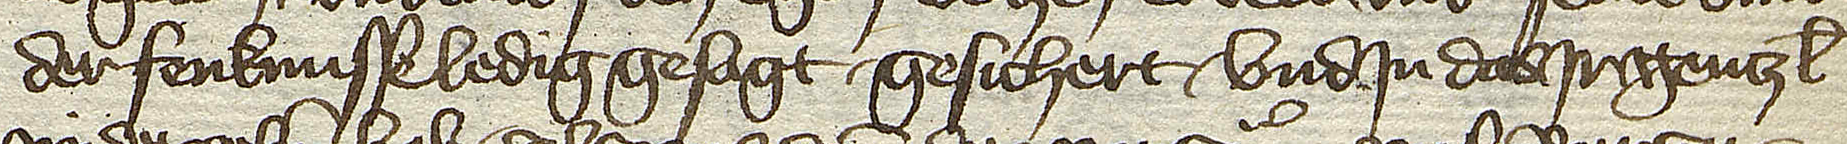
der fenknuſſe ledig geſagt / geſichert / vnd In das Ir gencʒl*
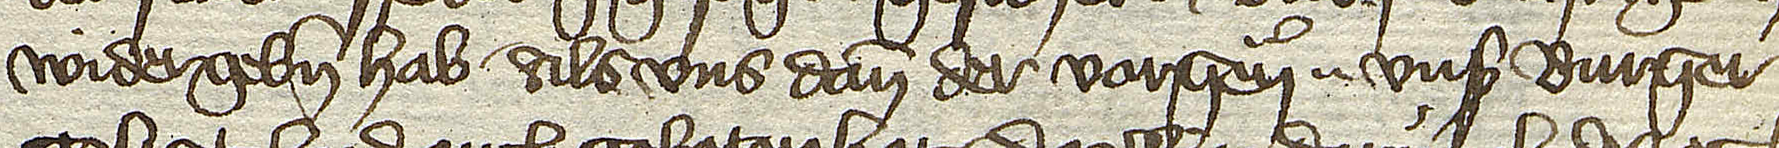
widergebn* hab / Als vns dan* der vorgen* ~ vnſ* Burger
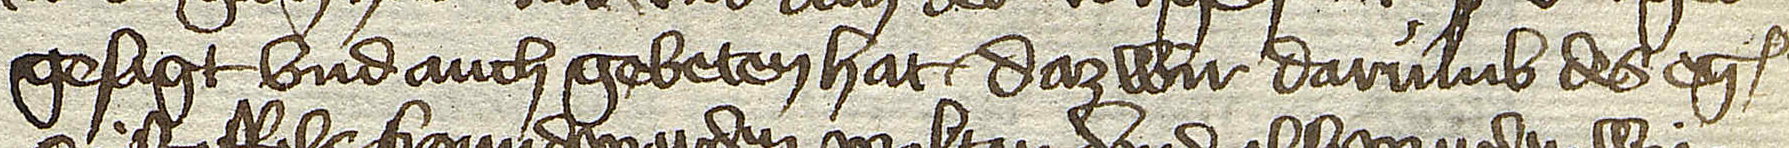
geſagt vnd auch gebeten hat / daʒ wir darümb des eg*
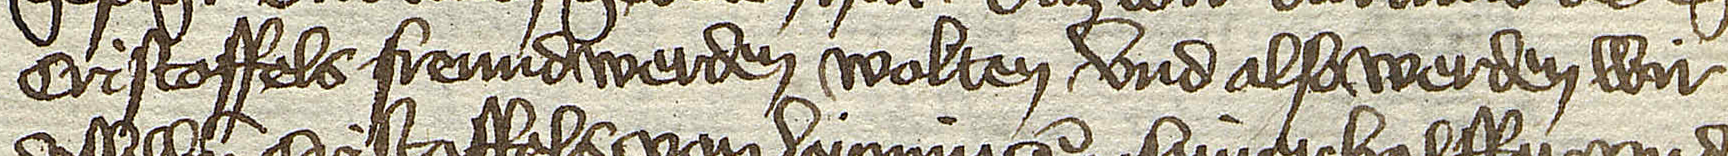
Criſtoffels frend werden wolten / vnd alſo werden wir
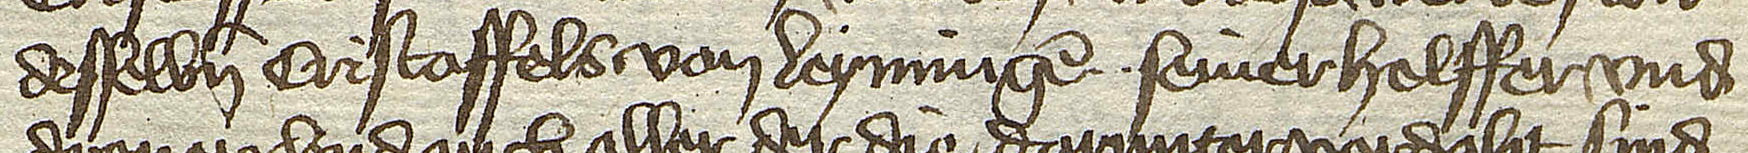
deſſelbn* Criſtoffels von leyminge* ~ ſeiner helffer vnd
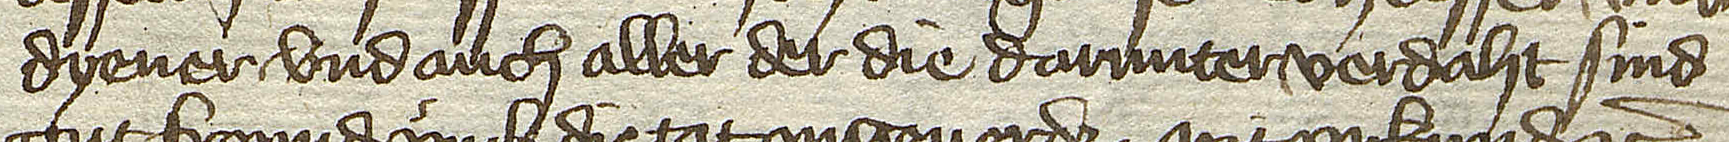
dyener / vnd auch aller der die darunter verdaht ſind
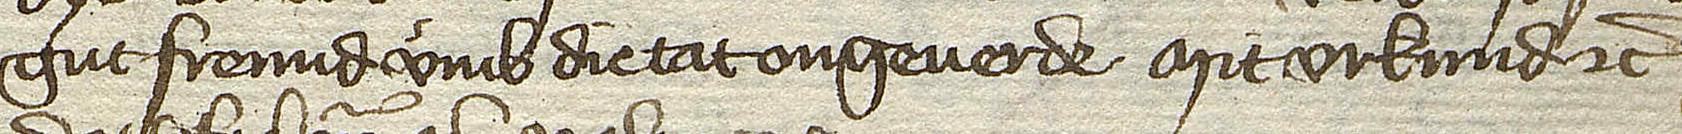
gut freund v̈mb die tat ongeuerde Mit vrkund ec*
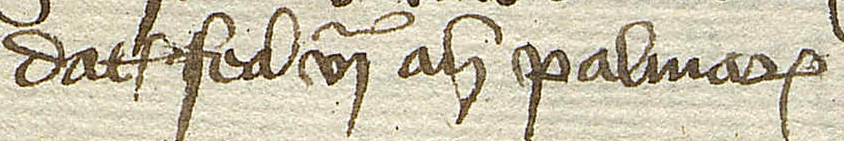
dat* fe*a vi* an* Palma*
